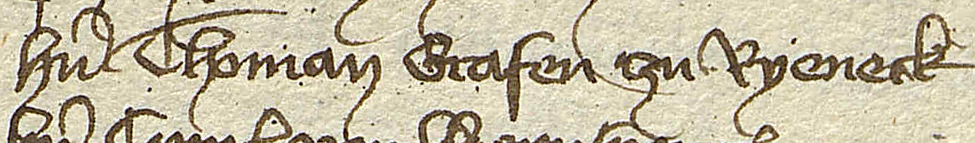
hn* Thoman Grafen cʒu Ryeneck
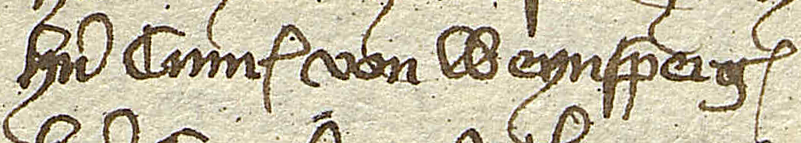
hn* Cunr* von weynſperg*
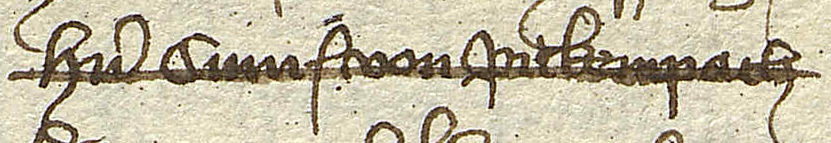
hn* Cunr* von pickenpach
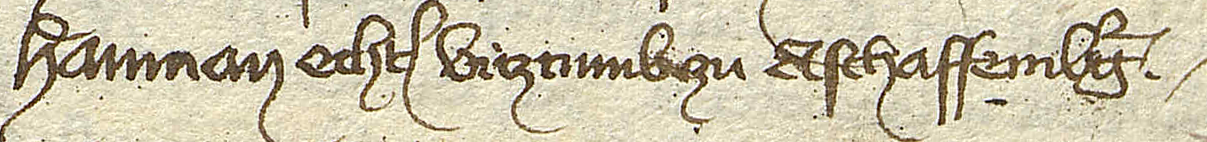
hanman echt* vicʒtumb cʒu Aſchaffemb*g . /
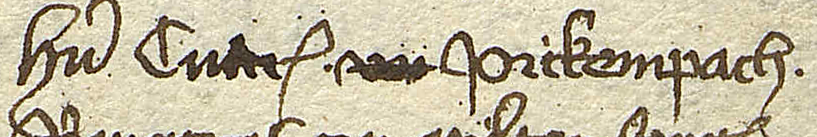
hn* Cunr* . vo Pickempach
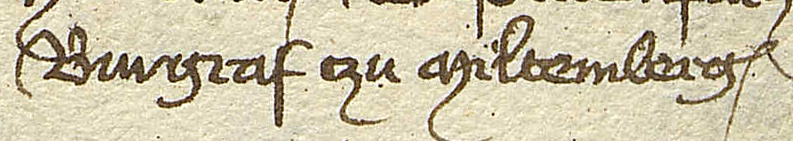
Burgraf cʒu Miltemberg*
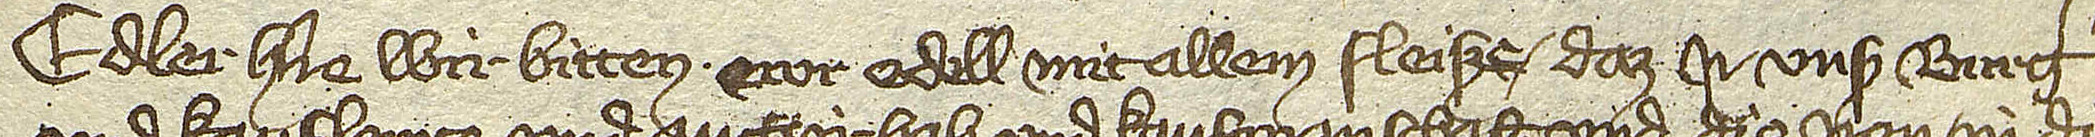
Edler h*re wir bitten ewr edell mit allem fleiſʒe / daʒ Ir vnſ* Burg*
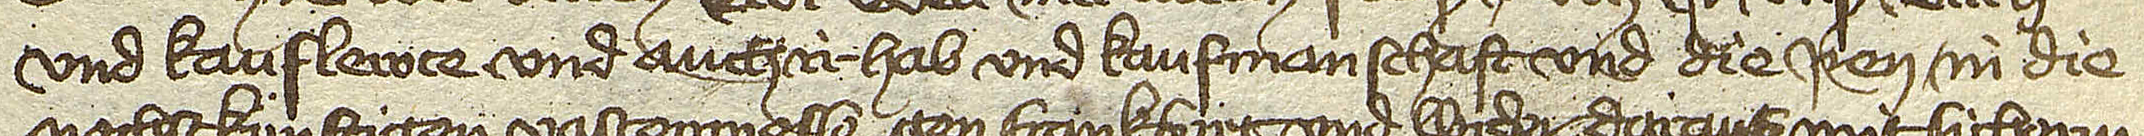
vnd kauflewte vnd auch ir hab vnd kaufmanſchaft vnd die Iren / in die
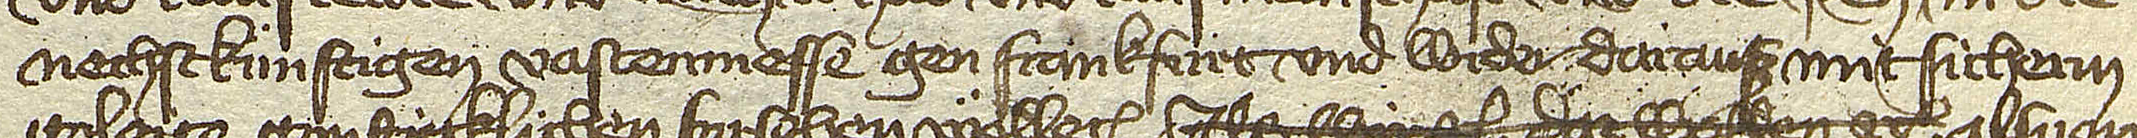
nechſtkünftigen vaſtenmeſſe gen frankfurt vnd wider darauſʒ mit ſicherm
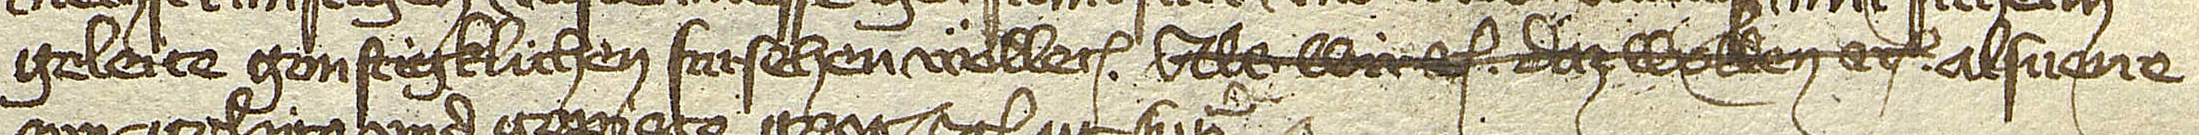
geleite günſtigklichen furſehen wöllet* . Als wir ec* . daʒ wollen ec* alſuerre
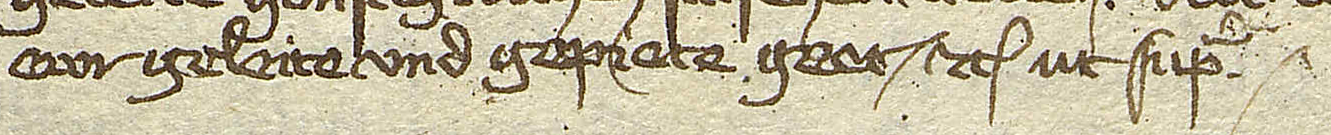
ewr geleite vnd gepiete geet / ec* ut ſup* . /
